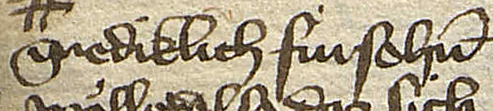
gnediklich fürſehn*
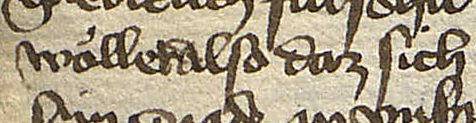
wöllen alſo daʒ ſich
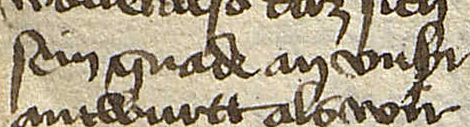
ſein gnade an vnſ*r
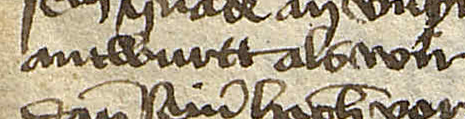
antwurtt als wir
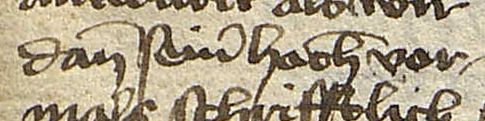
dan* ſein* hoch* vor -
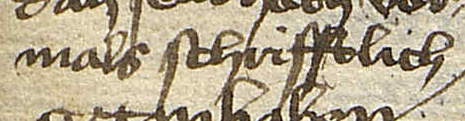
mals ſchrifftlich
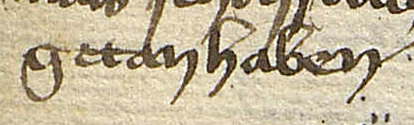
getan haben
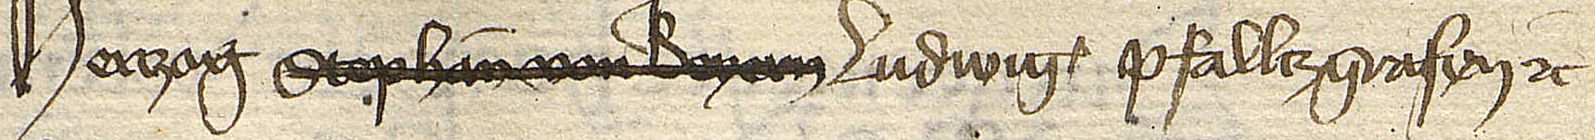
Hercʒog Stephan* von Beyern Ludwig* Pfalcʒgrafen ec*
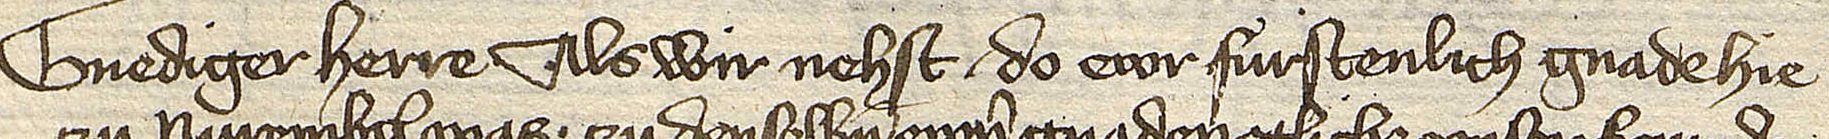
Gnediger herre Als wir nehſt / do ewr fürſtenlich gnade hie
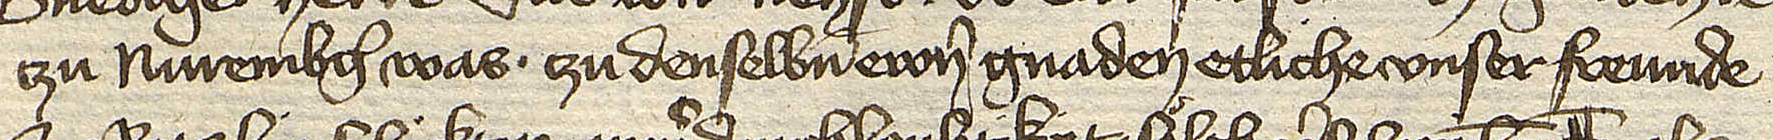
cʒu Nurembg* was . cʒu denſelbn* ewn* gnaden etliche vnſer freunde
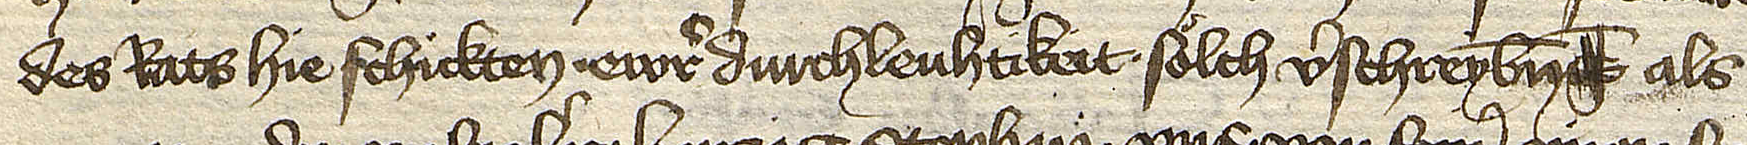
des Rats hie ſchickten ewr* durchleuhtikeit ſölch v*ſchreybn* als
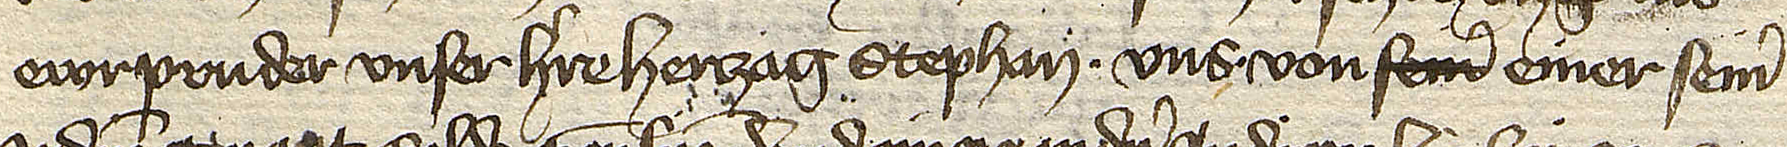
ewr pruder vnſer h*re hercʒog Stephan . vns von ſein* einer ſein*
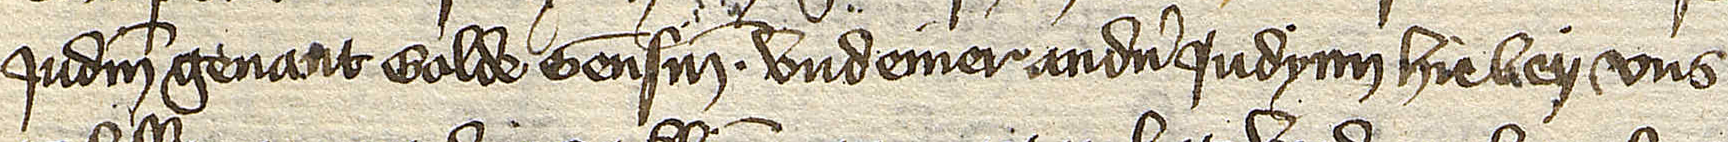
Iudin* genant Golde Genſin* . vnd einer andn* Iudynn hie bey vns
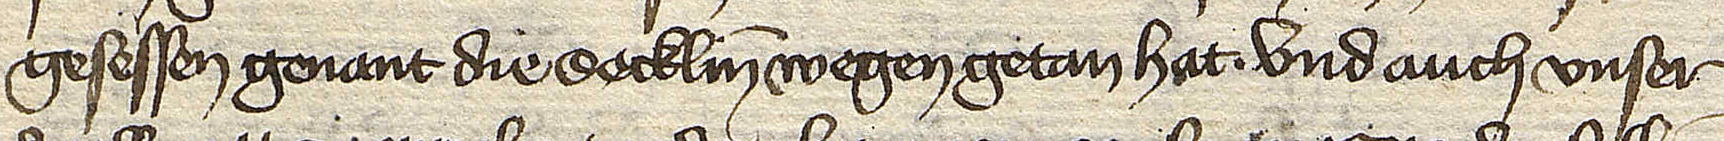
geſeſſen genant die Secklin* wegen getan hat . vnd auch vnſer
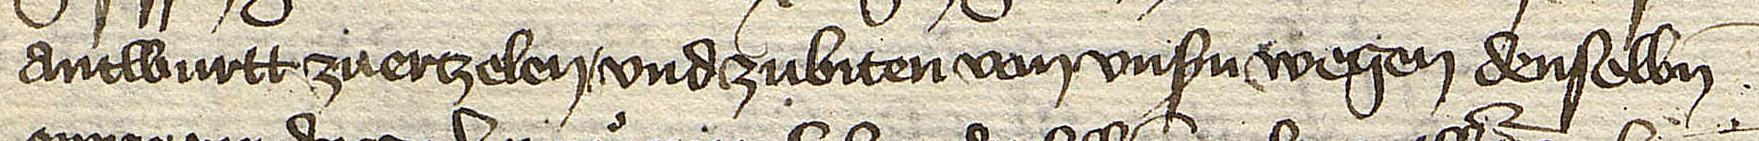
Antwurtt ʒuercʒelen / vnd cʒubiten von vnſ*n wegen denſelbn*
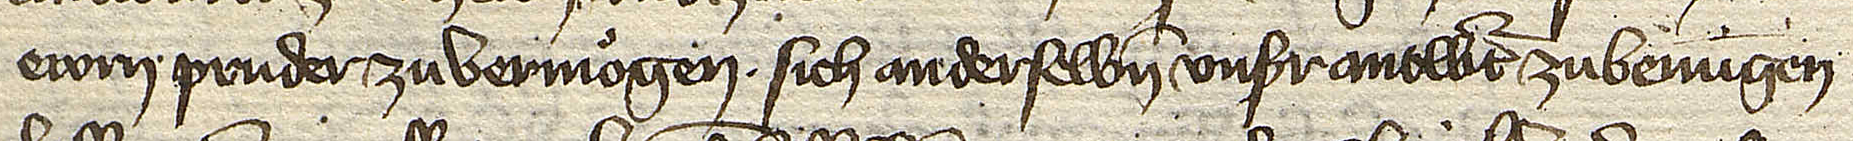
ewrn pruder cʒu vermögen . ſich an derſelbn* vnſ*r antw*t cʒubenügen
